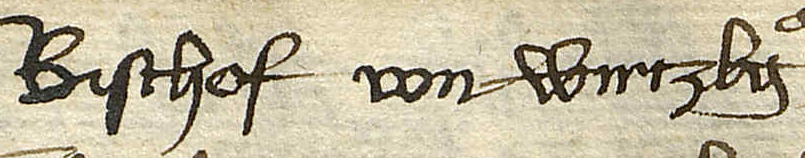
Biſchof von Wircʒb*g
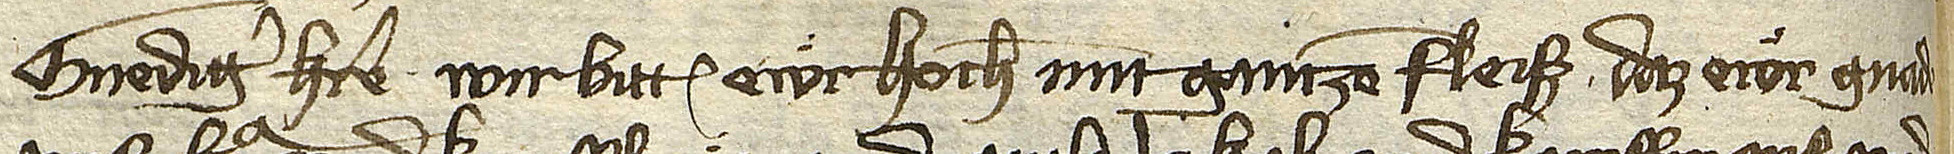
Gnedig* h*re . wir bitt* eẅr hoch* mit gancʒe* fleiſʒ . daʒ eẅr gnade
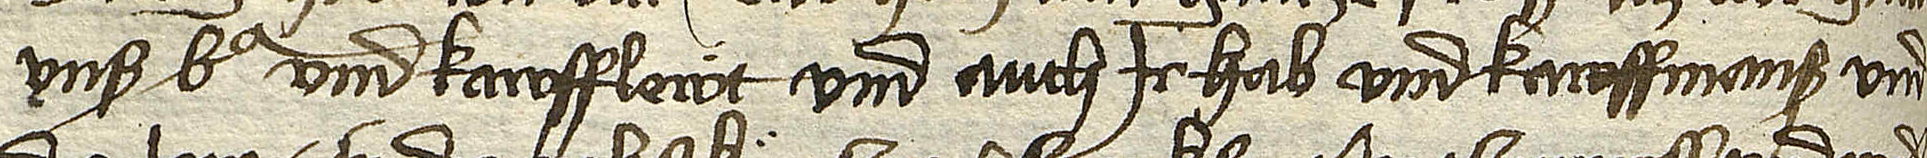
vnſ* b* vnd kawffleẅt vnd auch Ir hab vnd kawffmanſ* vnd
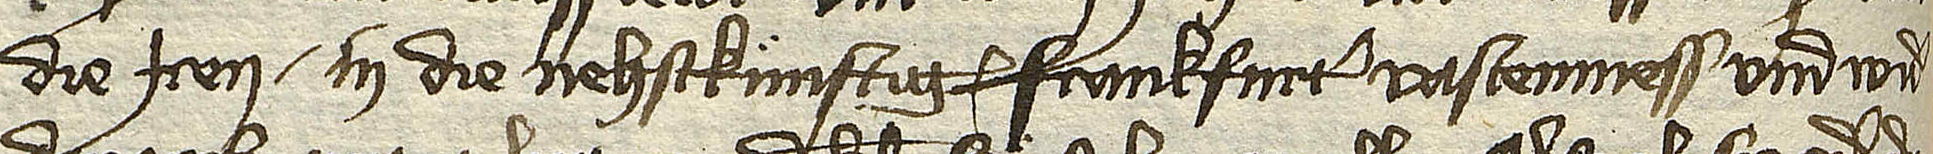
die Iren / in die nehſtkünſtig* frankfurt* vaſtenmeſſ vnd wid*
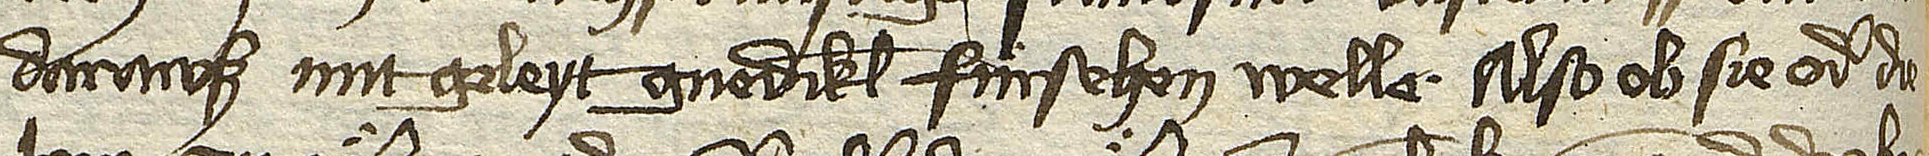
darawſʒ mit geleyt gendikl* fürſehen welle* . Alſo ob ſie od* die
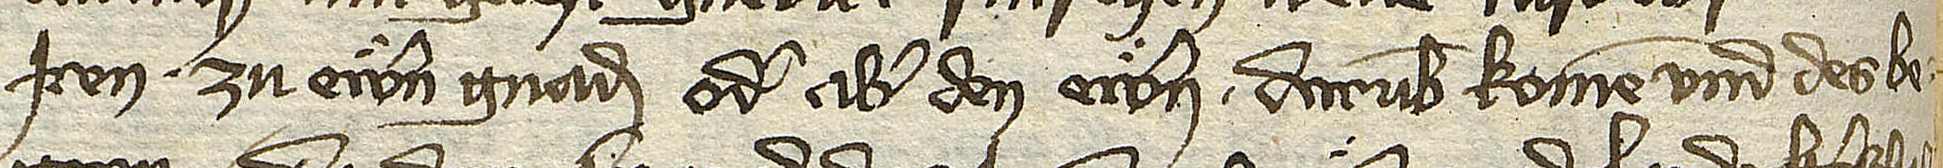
Iren . ʒu eẅn gnad* od* ab* den eẅ*n . darub* kome* von des be =
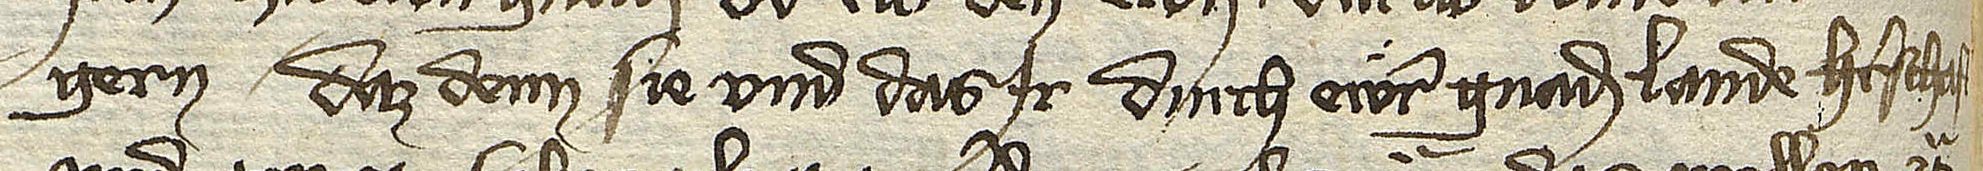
gern / Daʒ denn ſie vnd das Ir durch eẅr* gnad* lande h*rſchaft
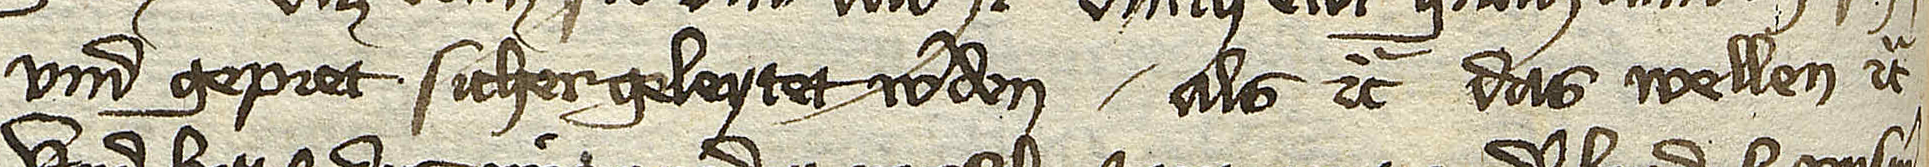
vnd gepiet ſicher geleytet w*den / als ec* das wellen ec*
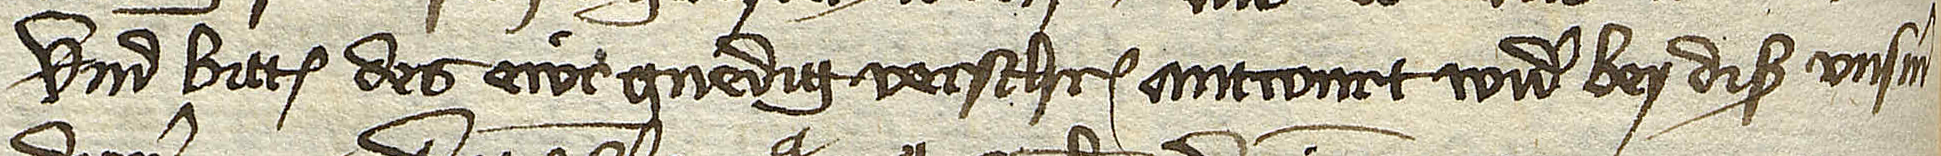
Vnd bitt* des eẅr gendig verſchr* antwurt wid* bey diſ* vnſ*m
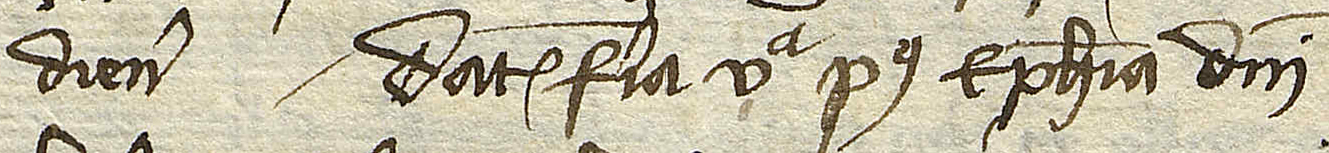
dien* / Dat* f*ia v* p* Ephia* dni*
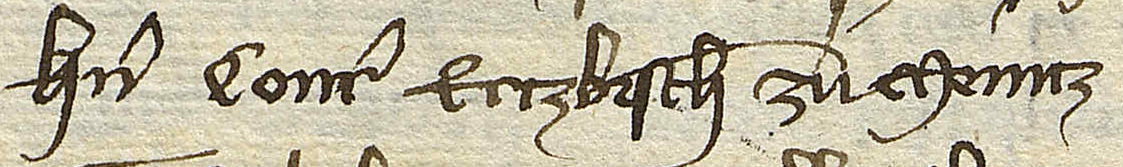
h*n Conr* Ercʒbiſch* ʒu Meincʒ
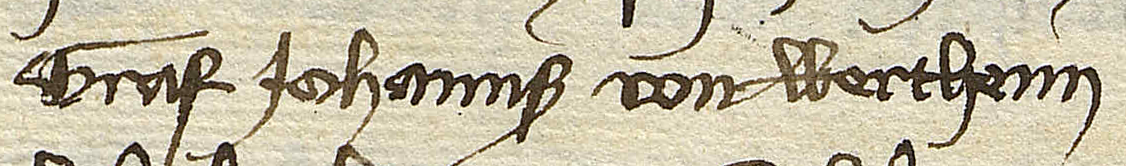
Graf Iohannſ* von Wertheim
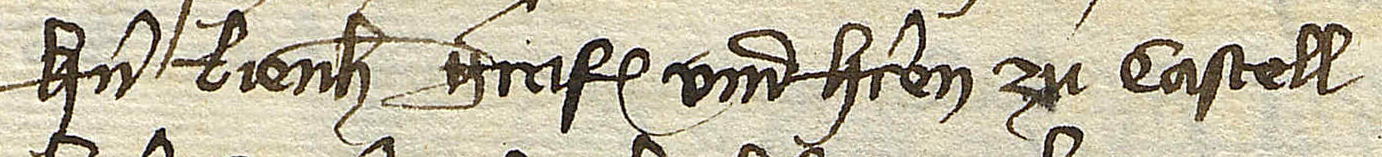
hn* lienh* graf* vnd h*ren ʒu Caſtell
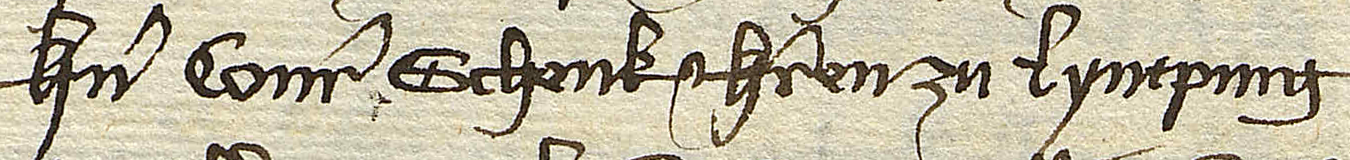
hn* Conr* Schenk* h*ren ʒu Lyntpurg
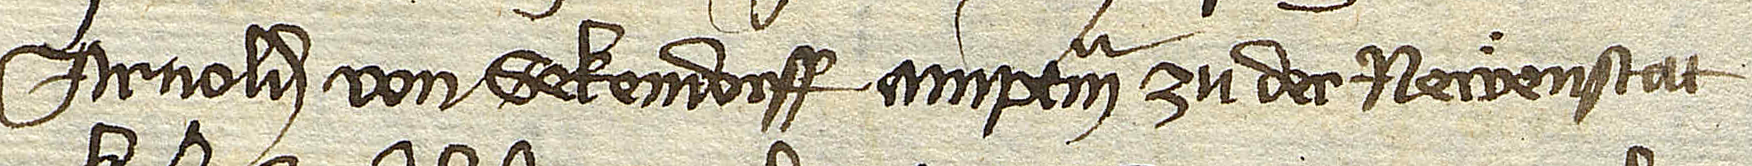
Arnold von Sekendorff amptm* ʒu der Neẅenſtat
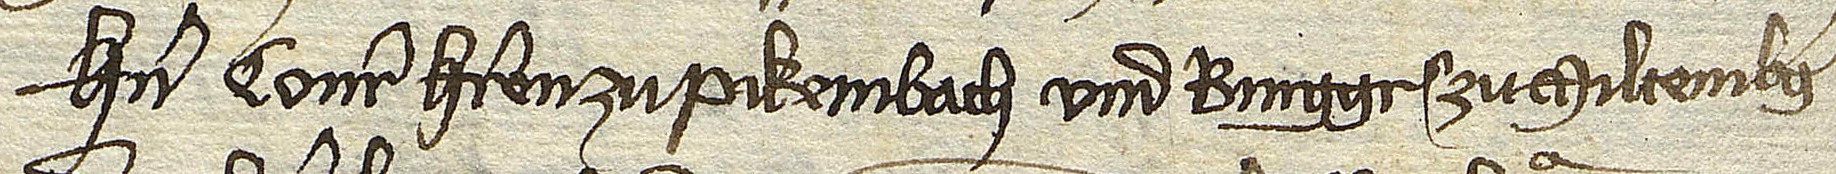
hn* Conr* h*ren ʒu pikembach vnd Burggr* ʒu Miltemb*g
